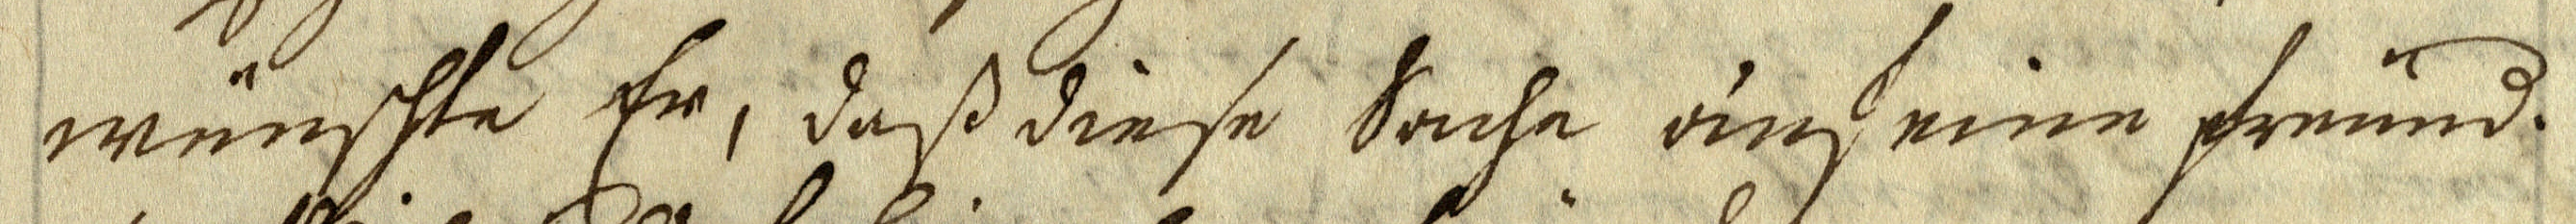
wünschte Er, daß diese Sache auf eine freund¬
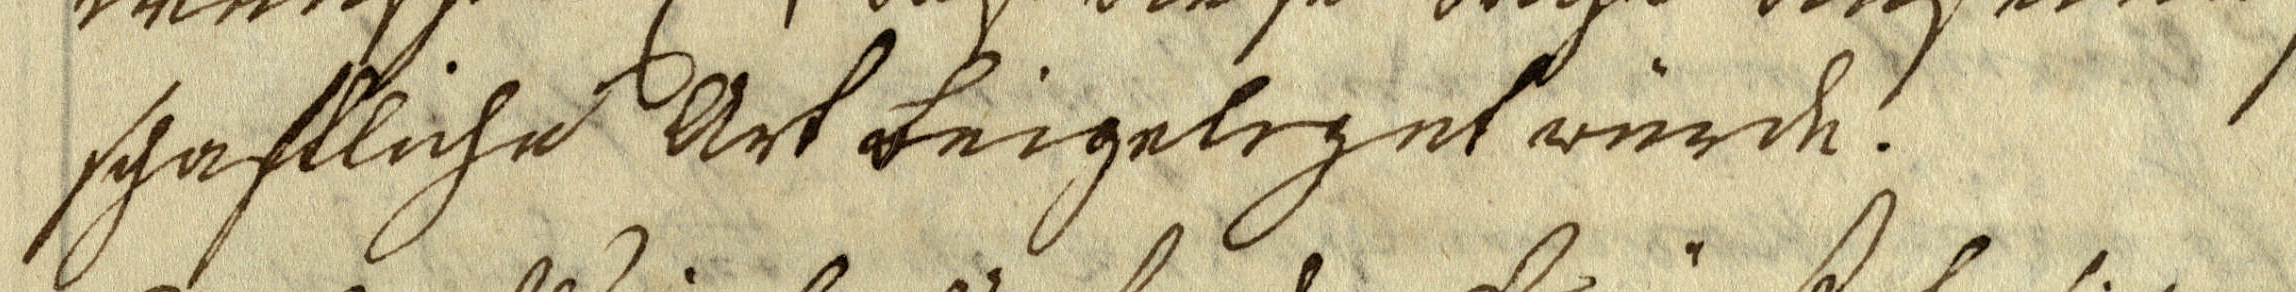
schaftliche Art beigeleget würde.
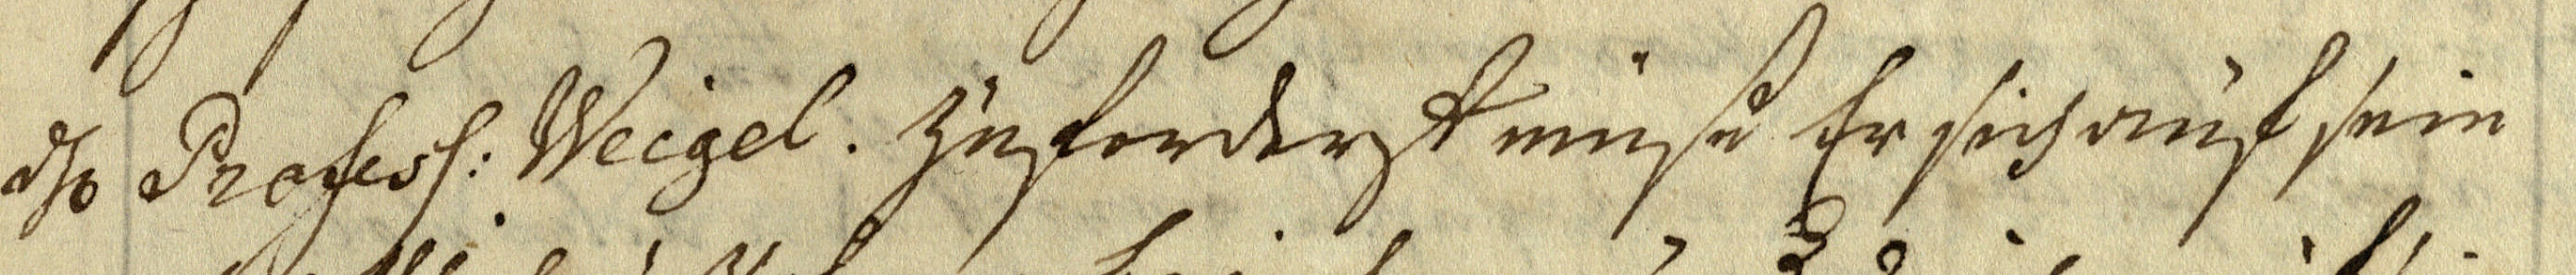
dh Profess: Weigel. Zuforderst müße Er sich auf sein
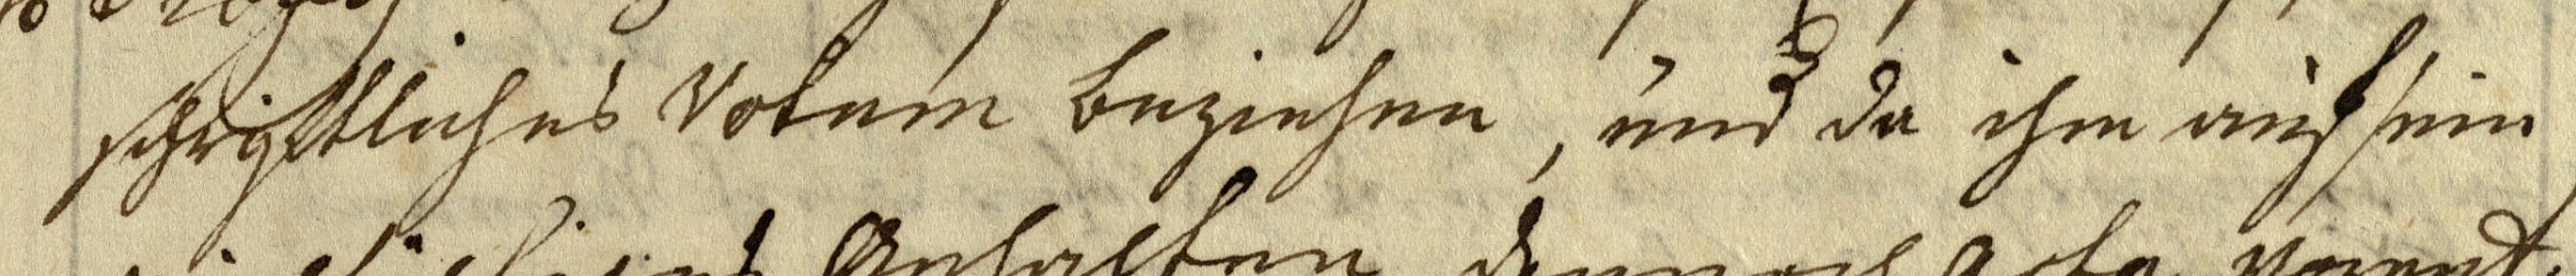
schriftliches Votum beziehen, und da ihm auf sein
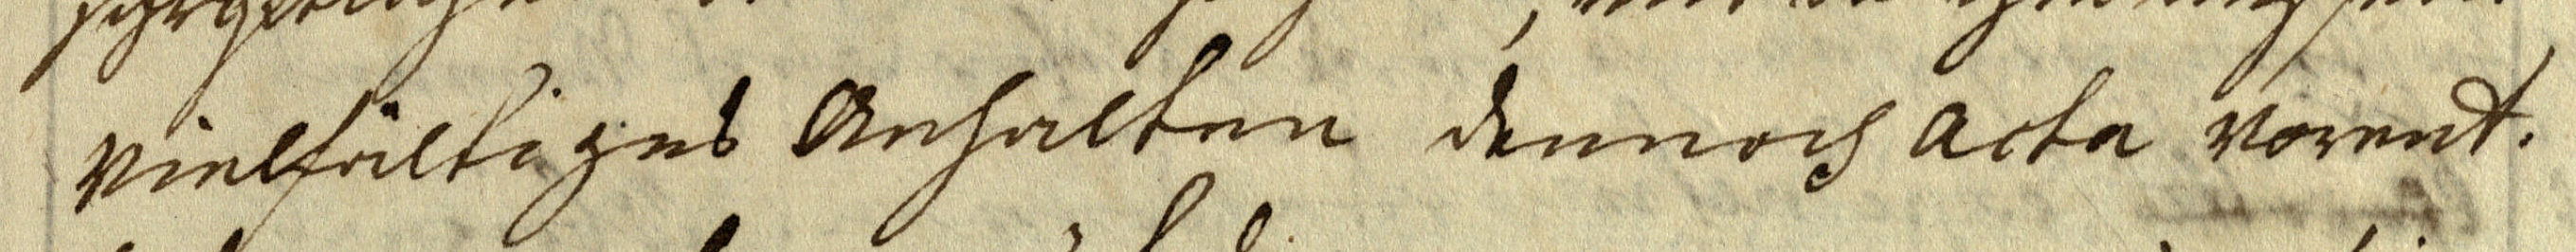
vielfältiges Anhalten dennoch Acta vorent¬
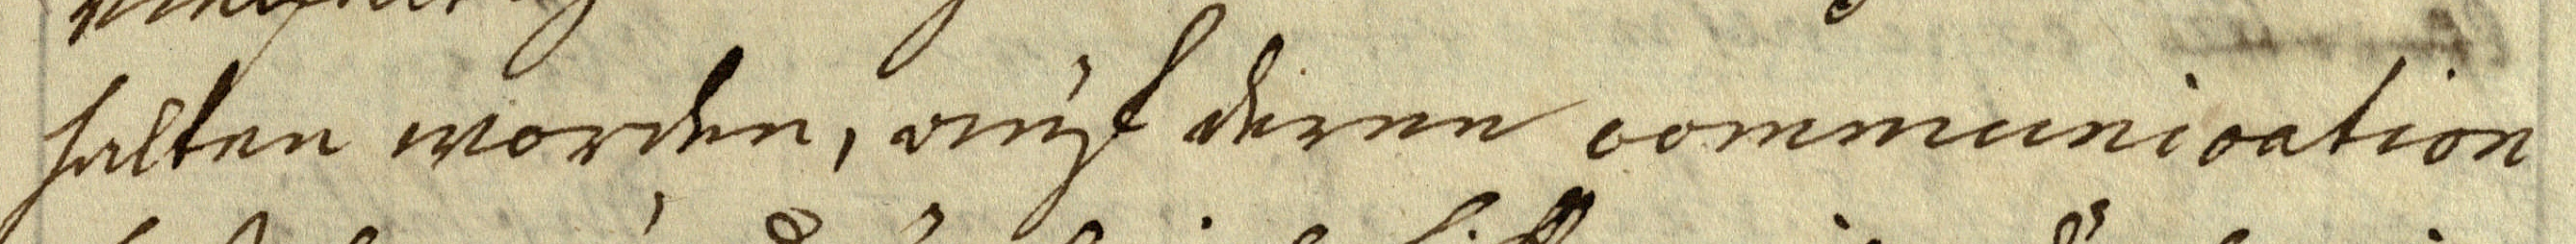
halten worden, auf deren communication
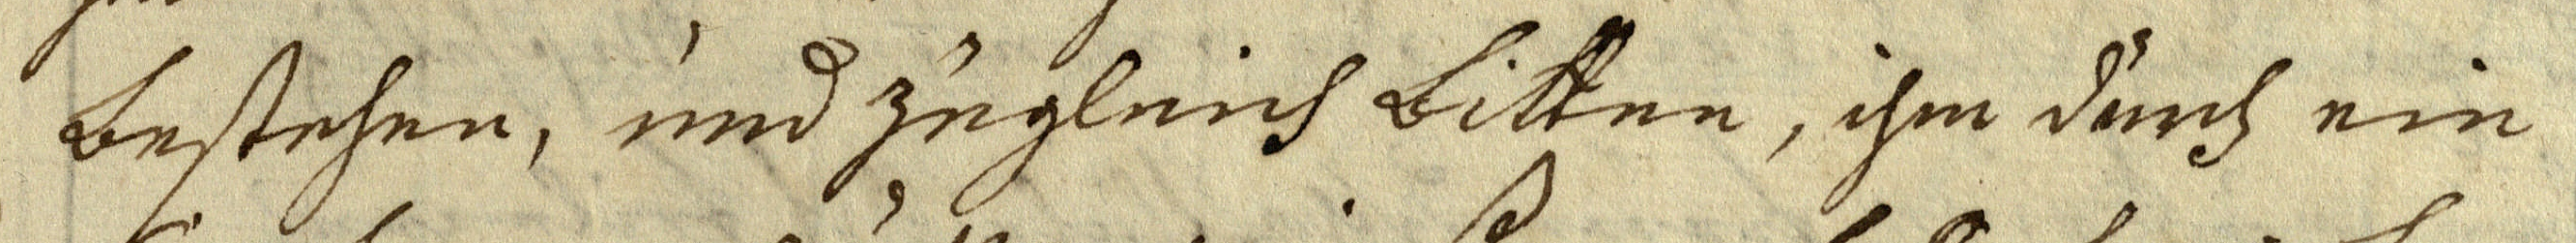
bestehen, und zugleich bitten, ihm durch ein
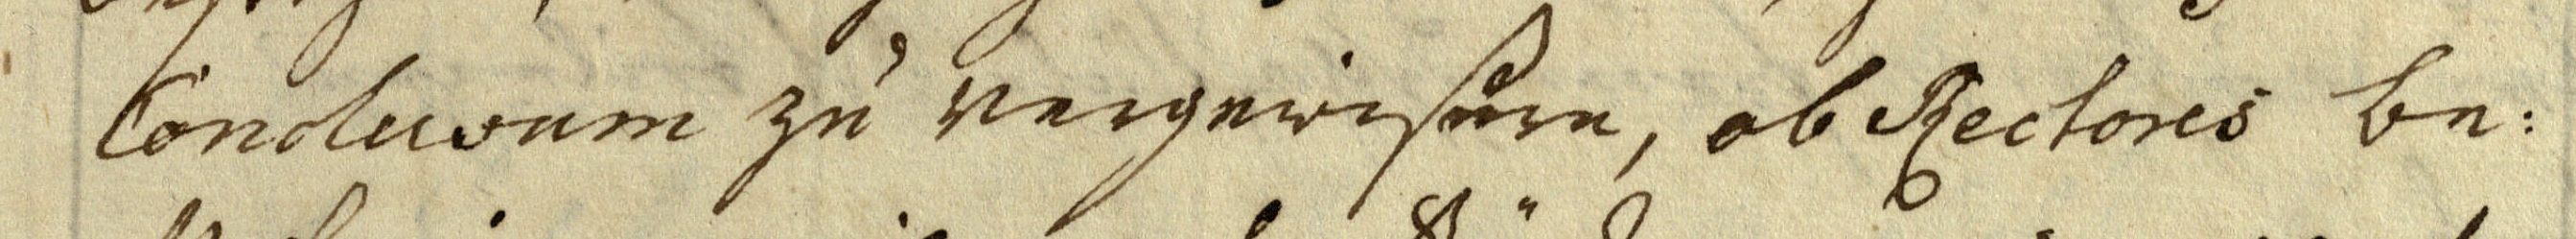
Conclusum zu vergewißern, ob Rectores be¬
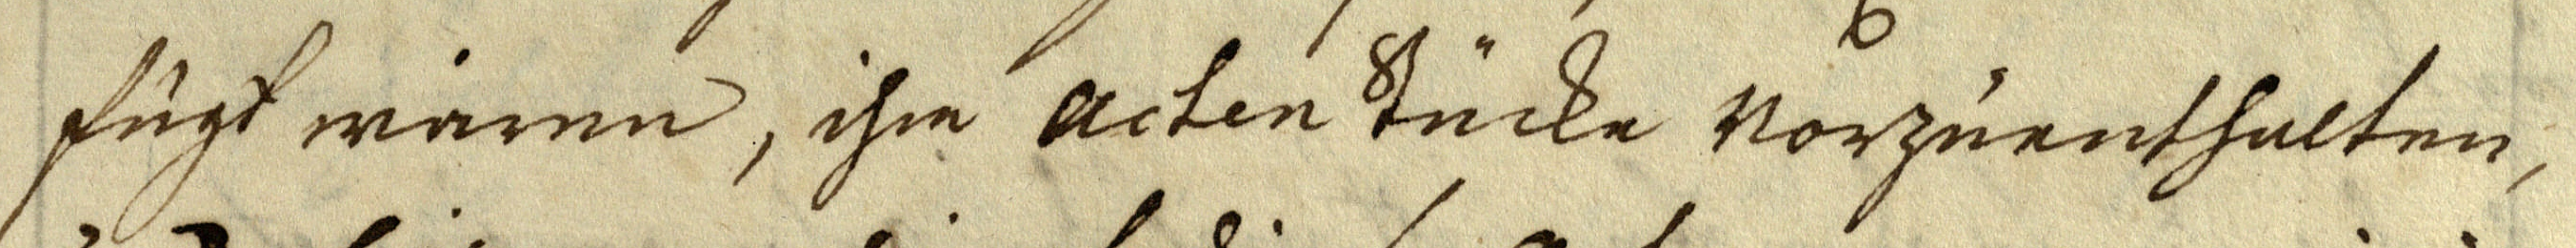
fugt wären, ihm Acten Stücke vorzuenthalten,
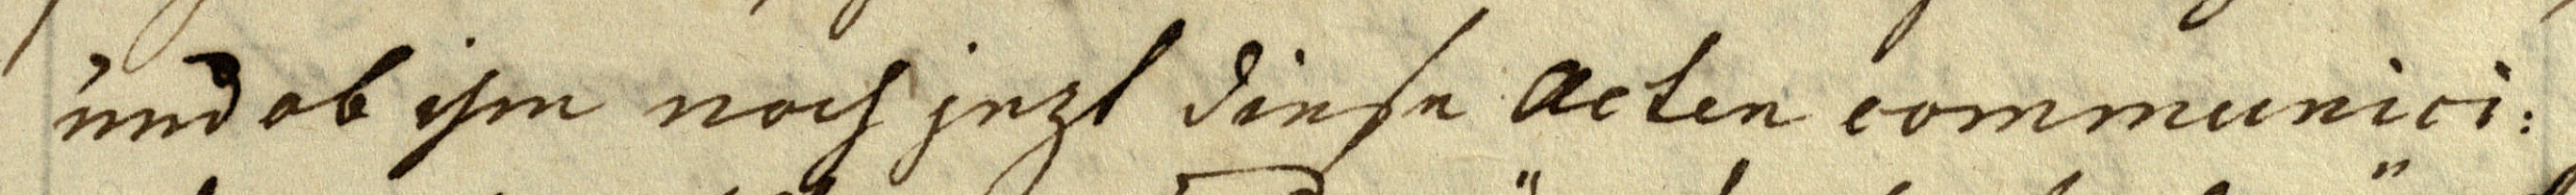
und ob ihm noch jezt diese Acten communici¬
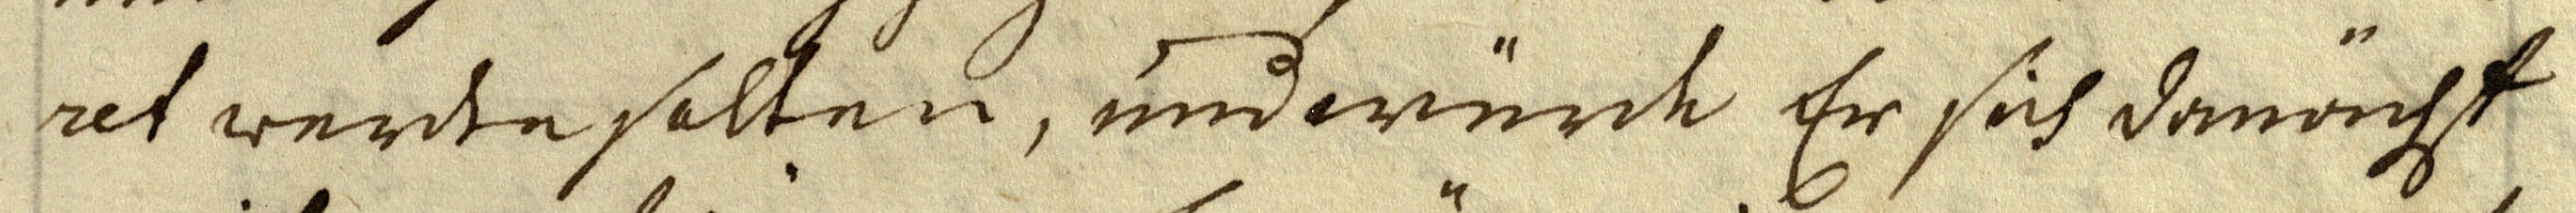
ret werden solten, und würde Er sich danächst
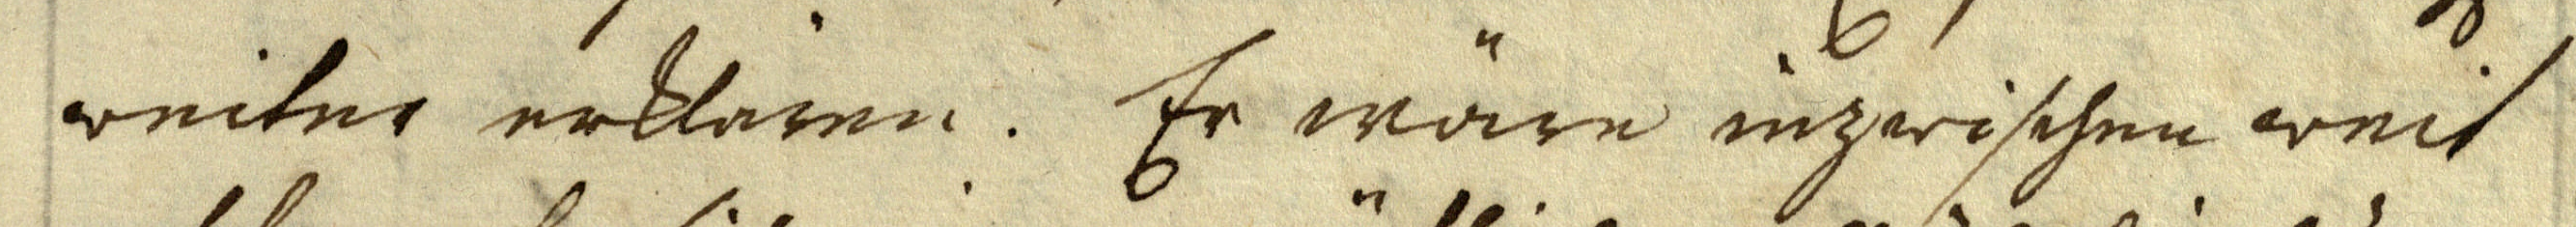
witer erklären. Er wäre inzwischen weit
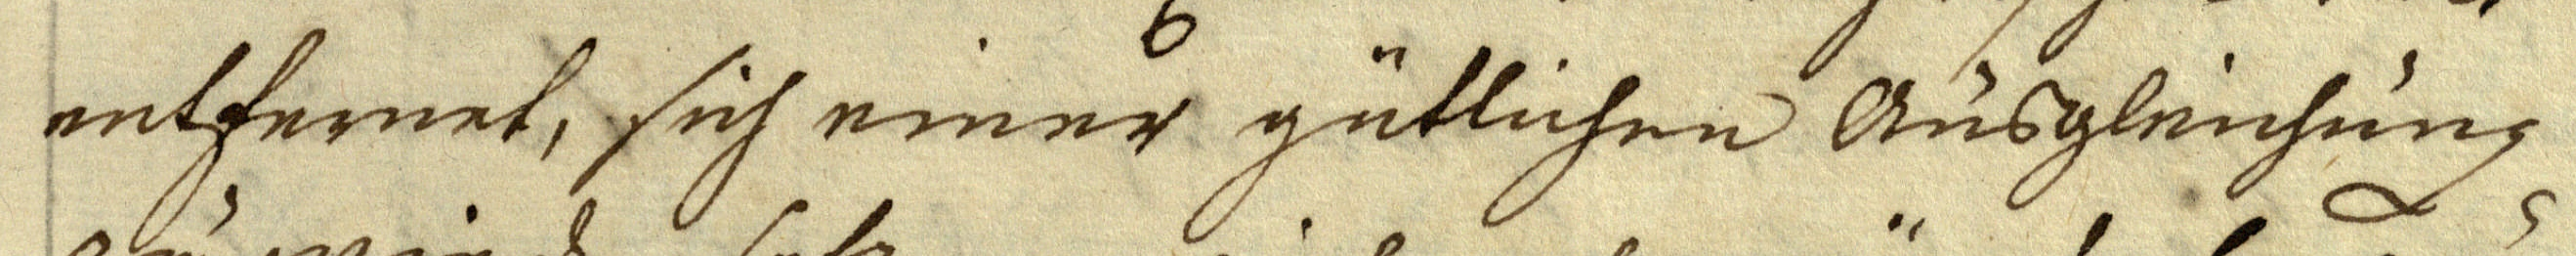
entfernet, sich einer gütlichen Ausgleichung
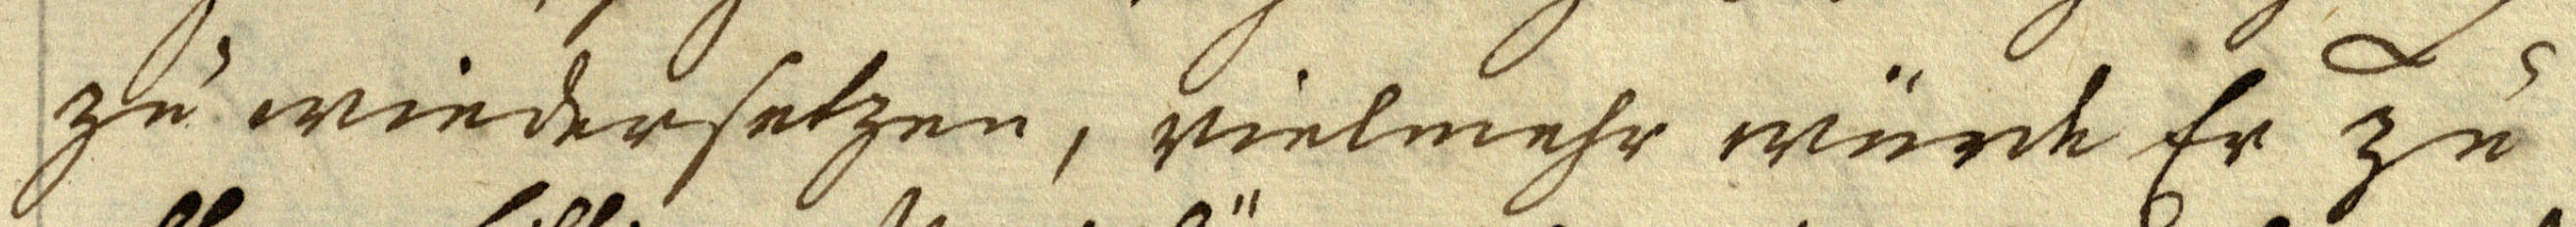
zu wiedersetzen, vielmehr würde Er zu
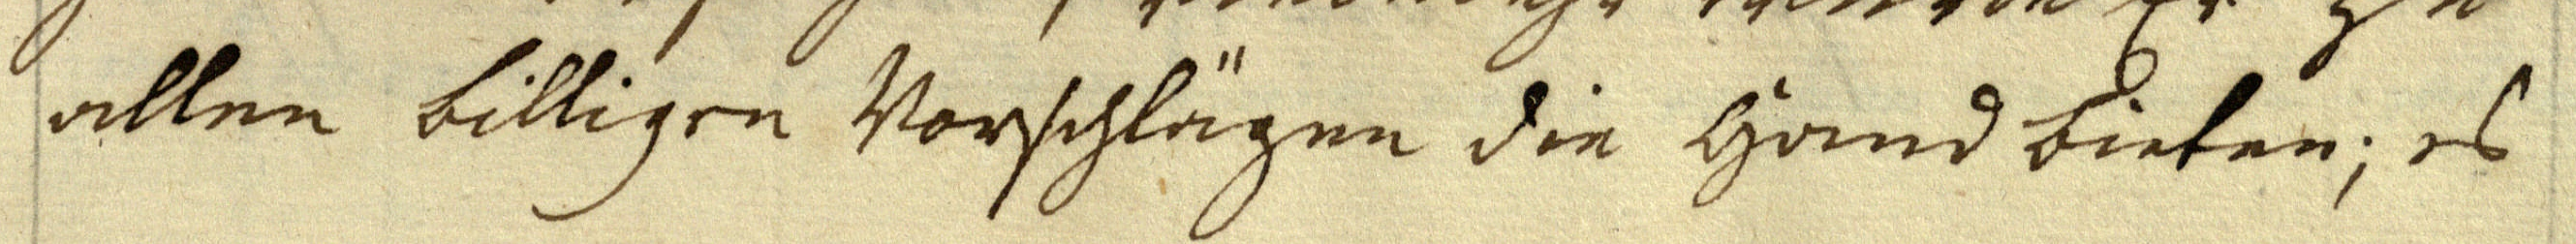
allen billigen Vorschlägen die Hand bieten; es
